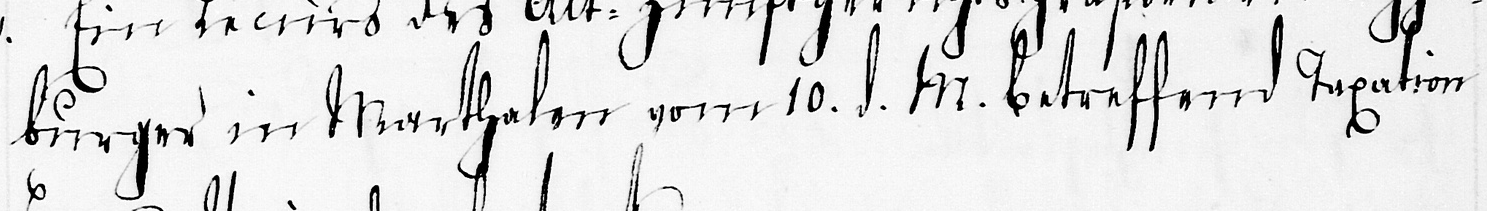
burger in Marthalen vom 10. d. M. betreffend Taxation
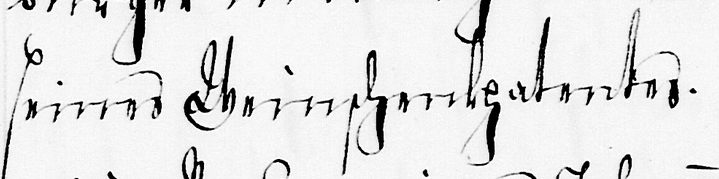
seines Weinschenkpatentes.
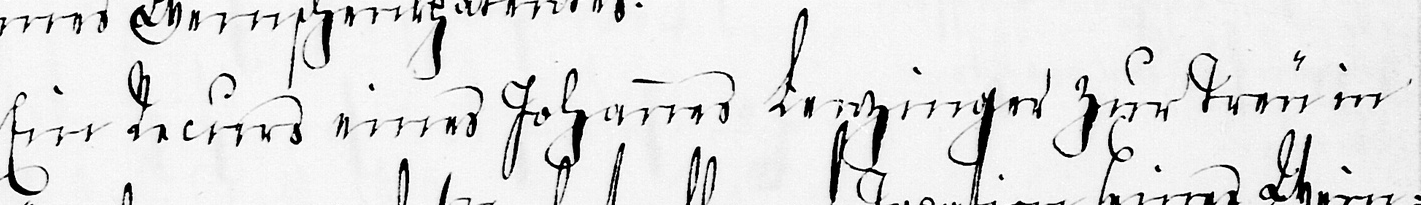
Ein Recurs eines Johannes Lenzinger zur Treu in
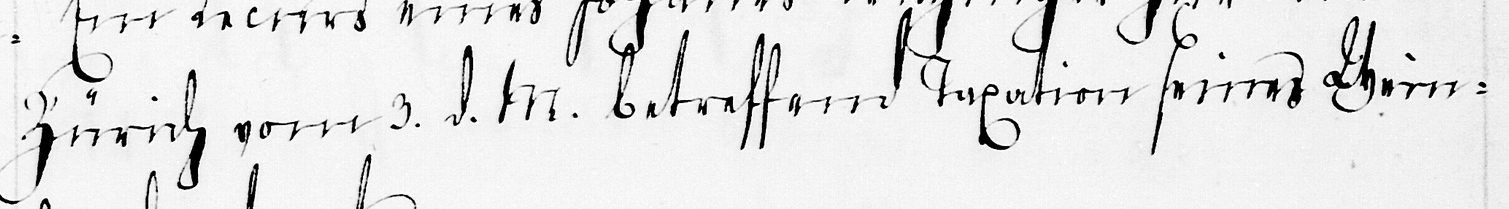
Zürich vom 3. d. M. betreffend Taxation seines Weins¬
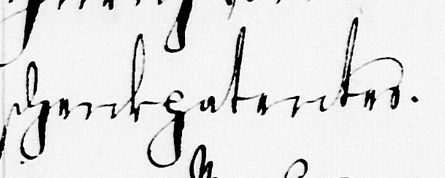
chenkpatentes.
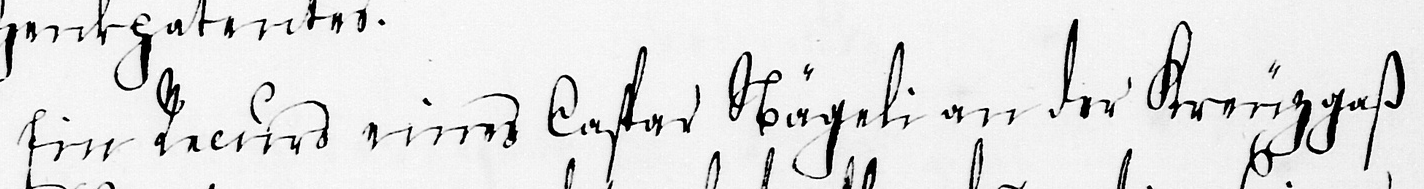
Ein Recurs eines Caspar Nägeli an der Kreuzgaß
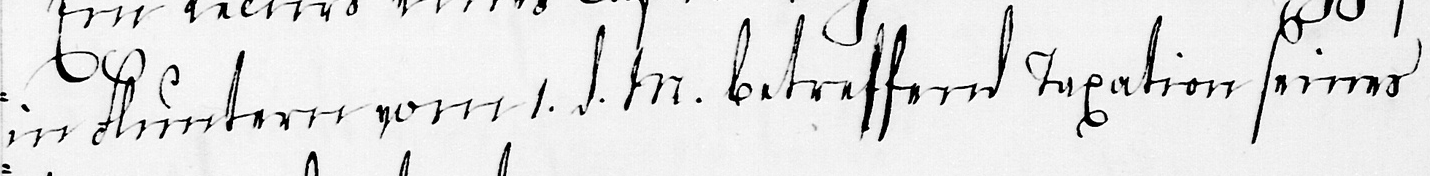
in Fluntern vom 1. d. M. betreffend Taxation seines
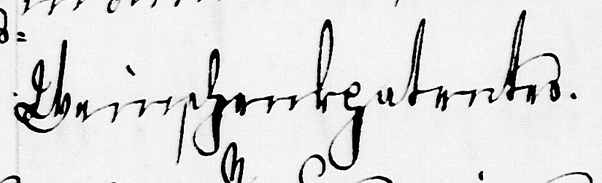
Weinschenkpatentes.
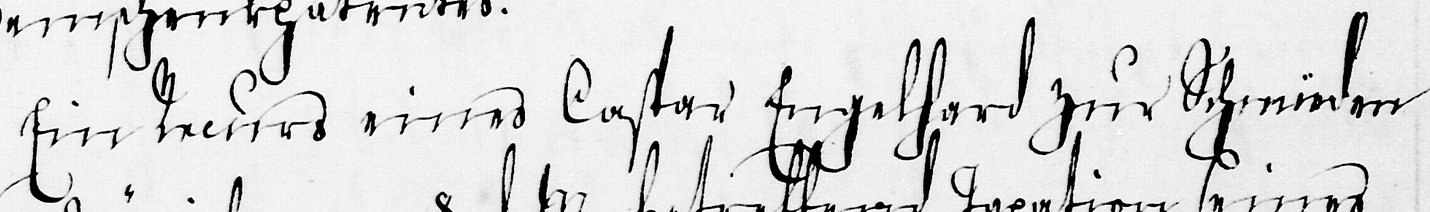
Ein Recurs eines Caspar Engelhard zur Schmieden
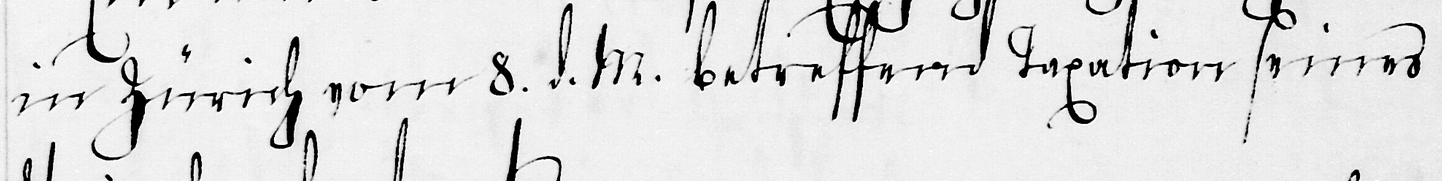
in Zürich vom 8. d. M. betreffend Taxation seines
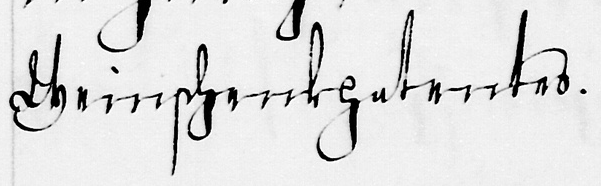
Weinschenkpatentes.
